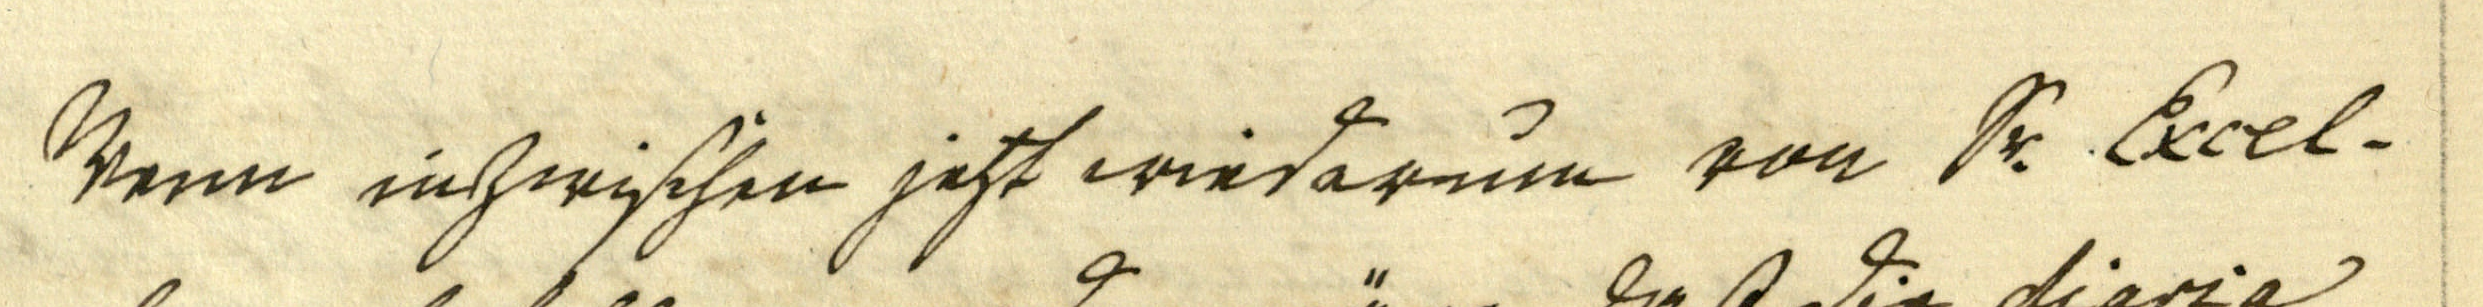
Wenn inzwischen jetzt wiederum von Sr Excel¬
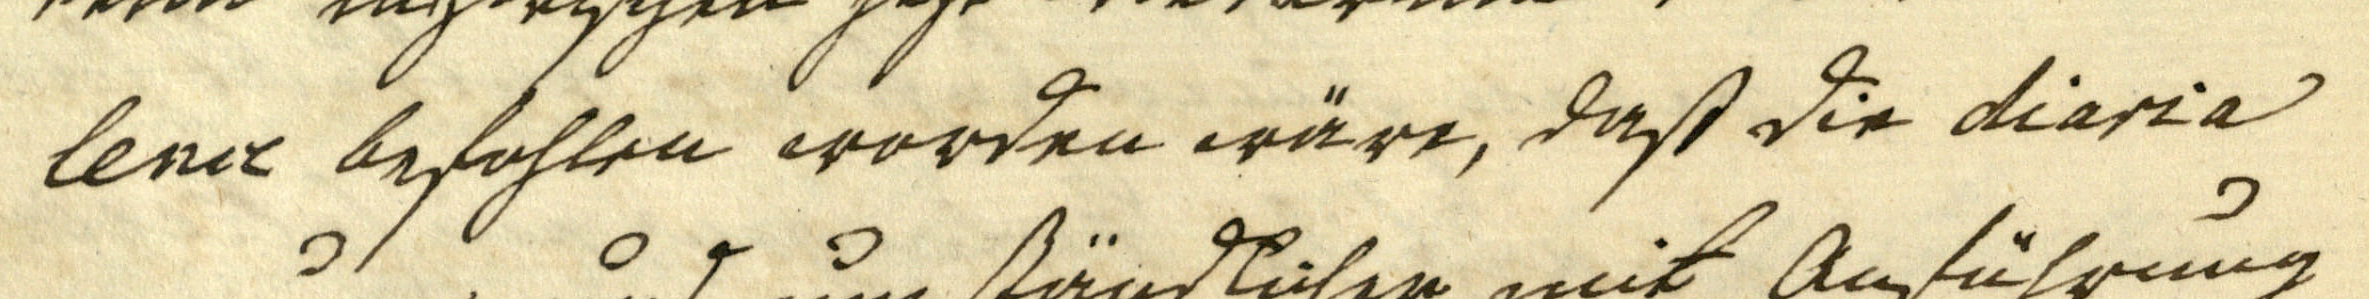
lence befohlen worden wäre, daß die diaria
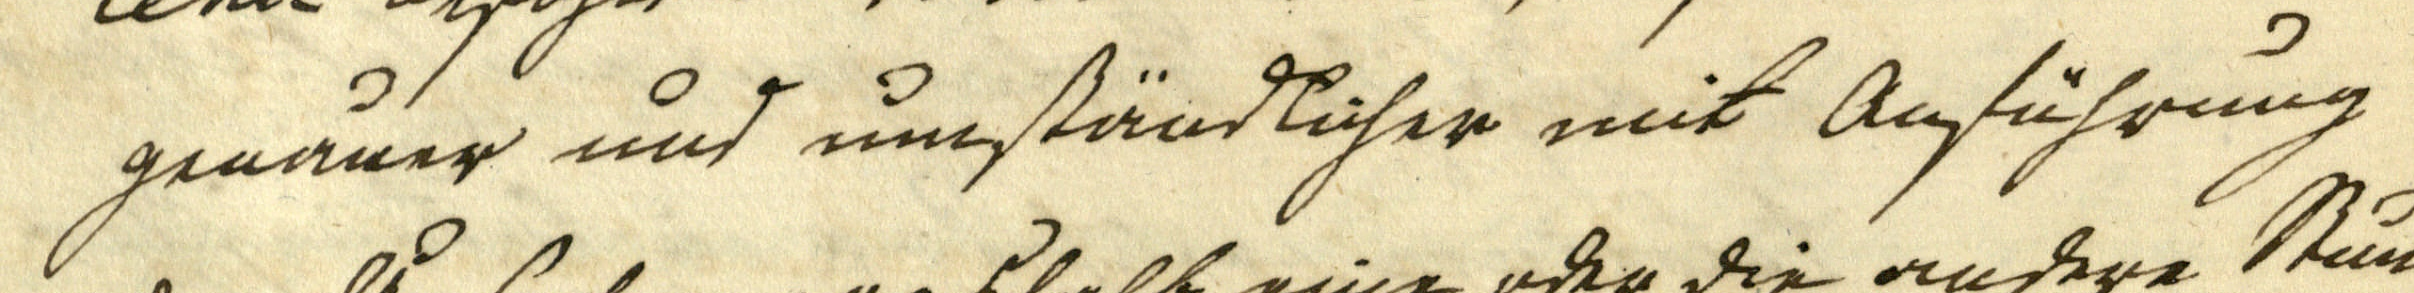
genauer und umständlicher mit Anführung
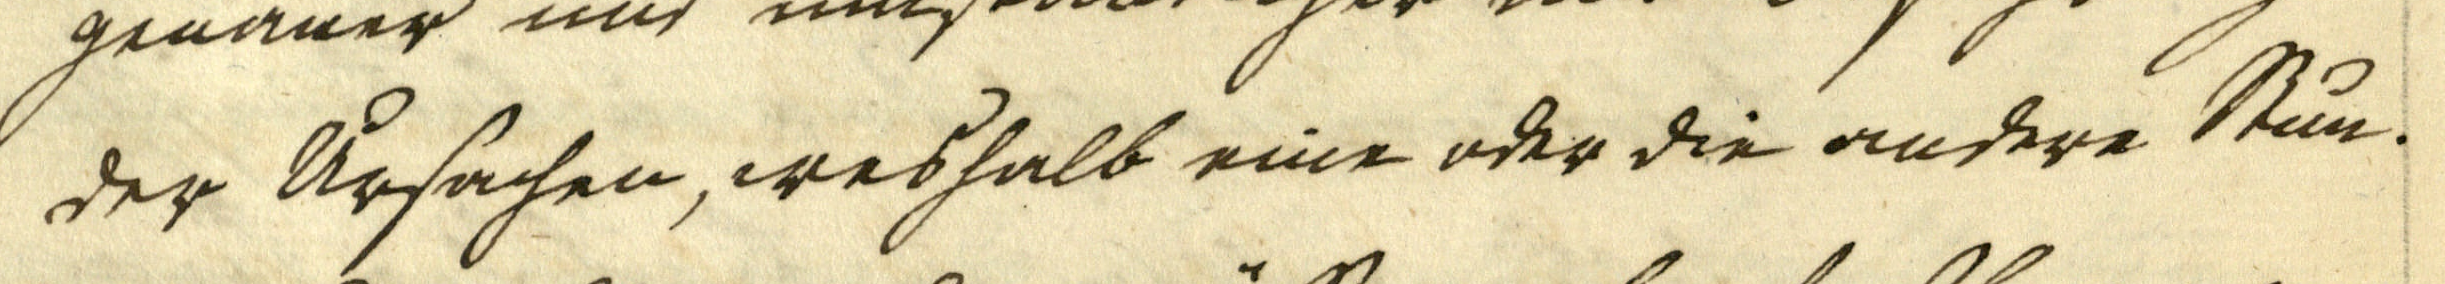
der Ursachen, weshalb eine oder die andere Stun¬
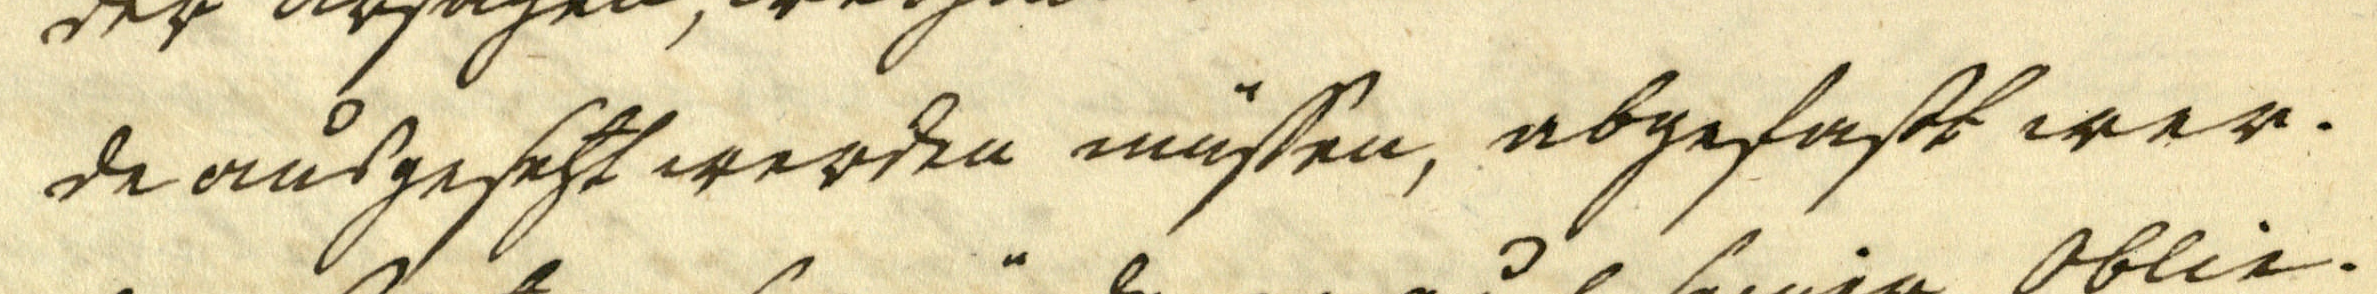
de ausgesetzt werden müssen, abgefaßt wer¬
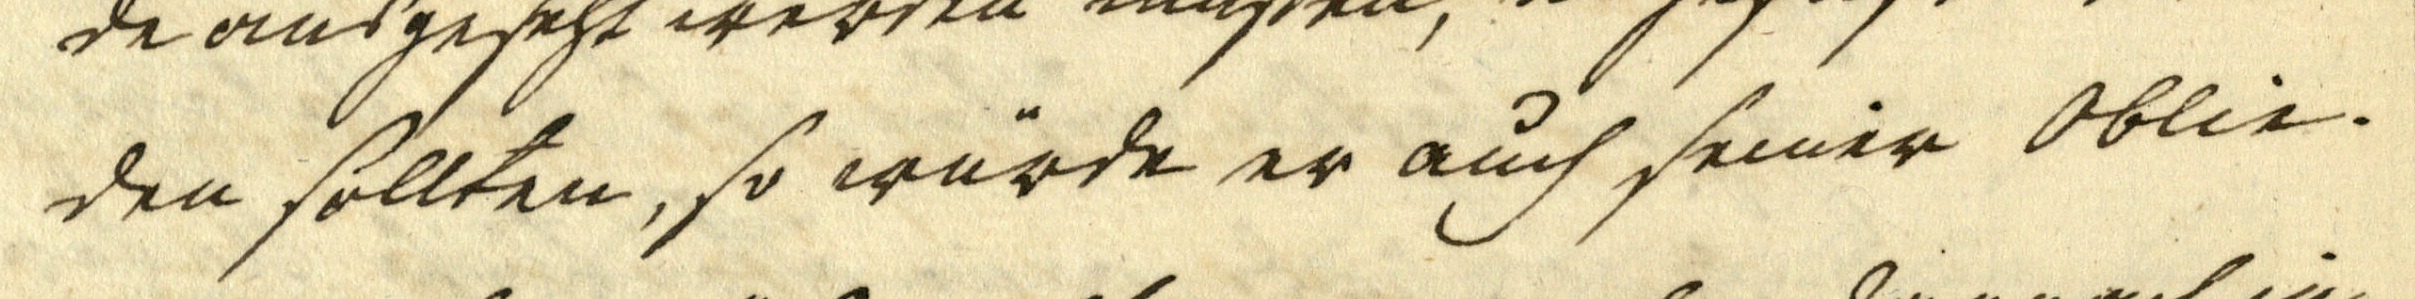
den sollten, so würde er auch seiner Oblie¬
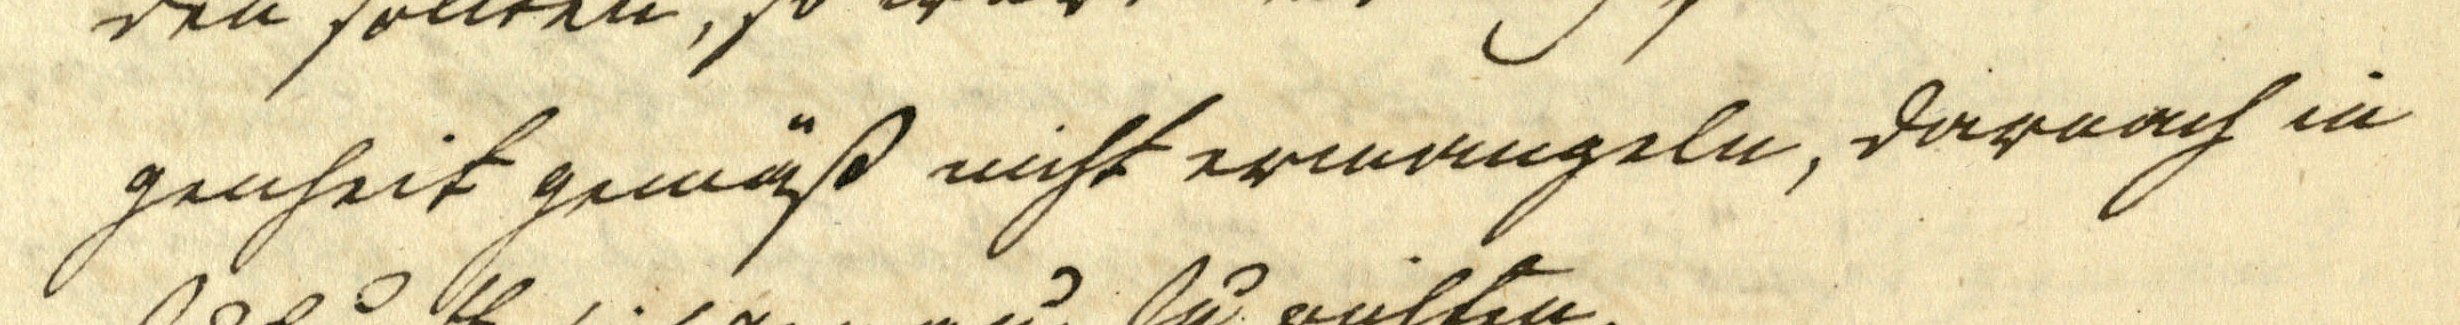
genheit gemäß nicht ermangeln, darnach in
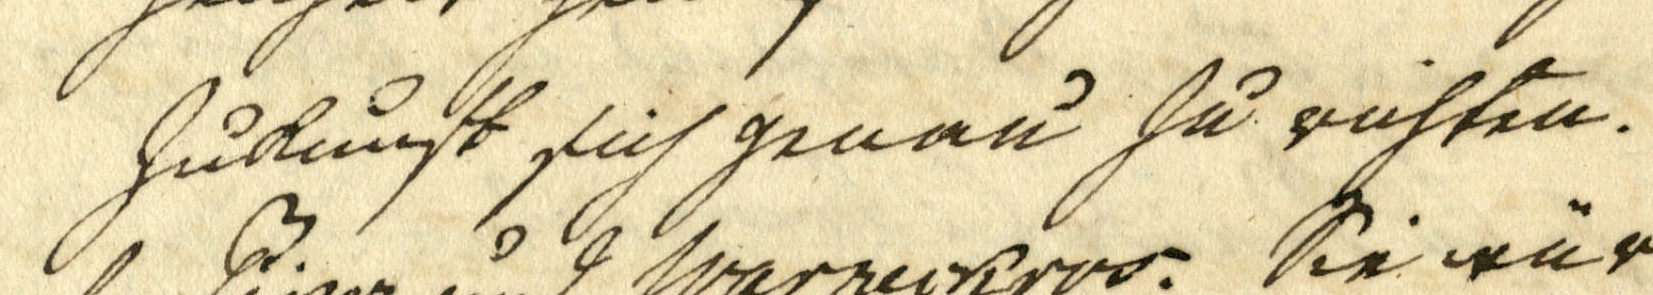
Zukunft sich genau zu richten.
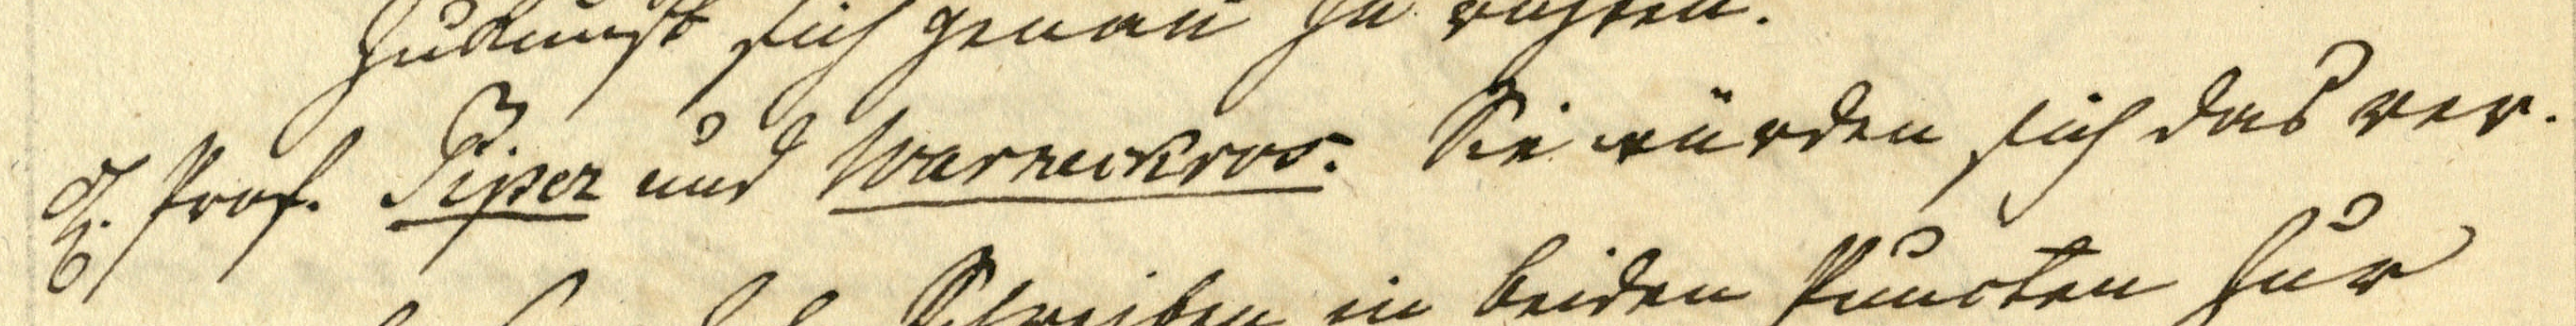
dh. Prof. Piper und Warneckros. Sie würden sich das ver¬
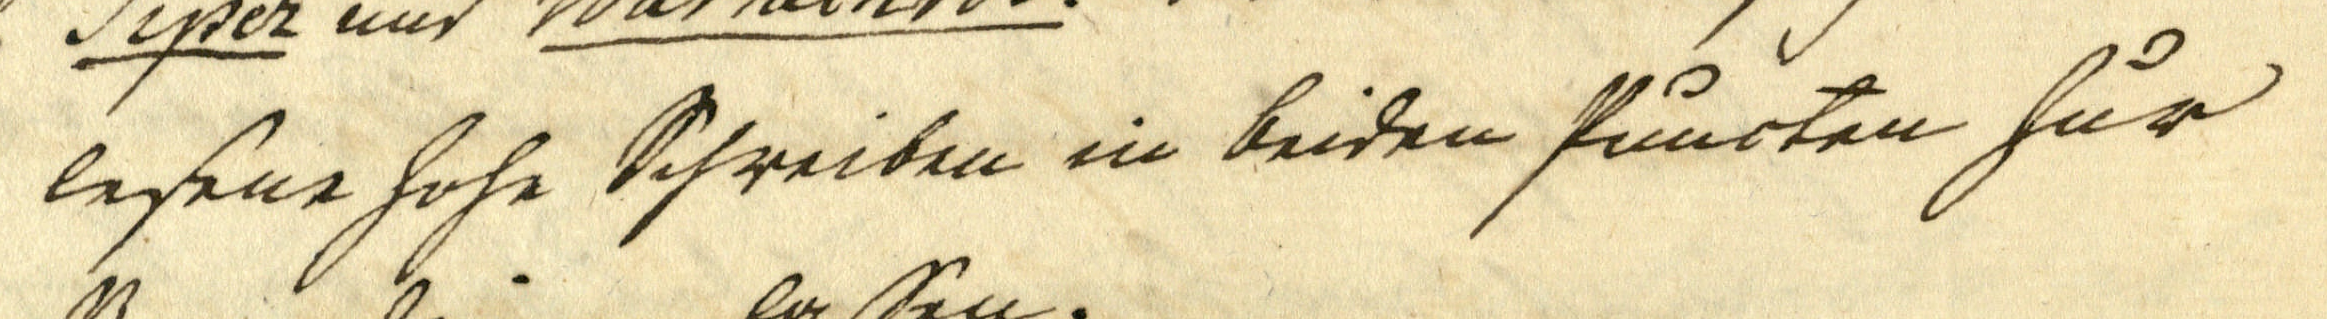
lesene hohe Schreiben in beiden Punckten zur
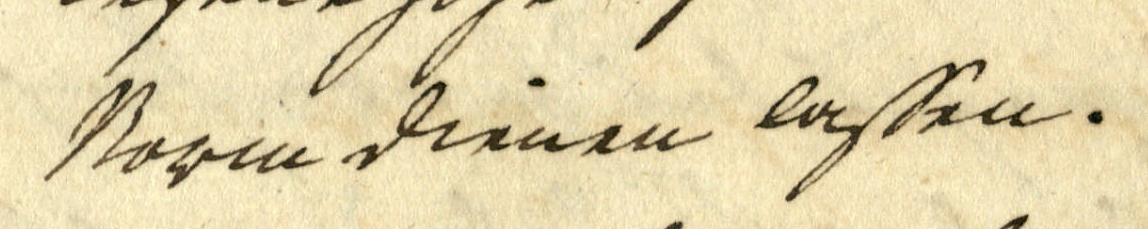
Norm dienen lassen.
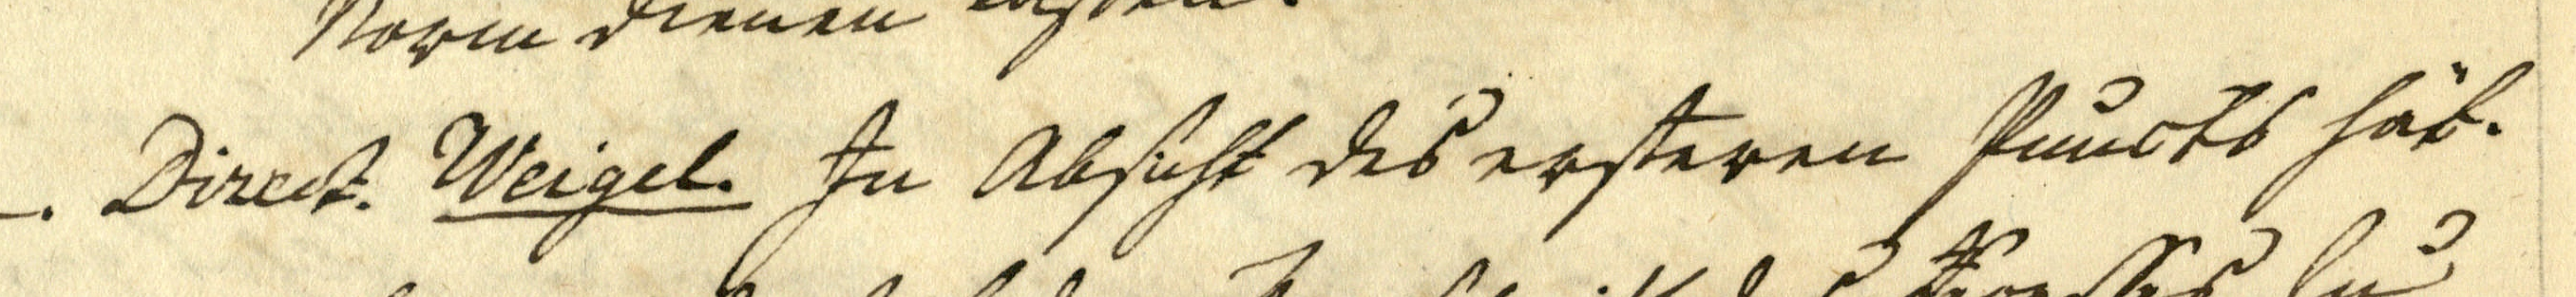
Direct. Weigel. In Absicht des ersteren Puncts hät¬
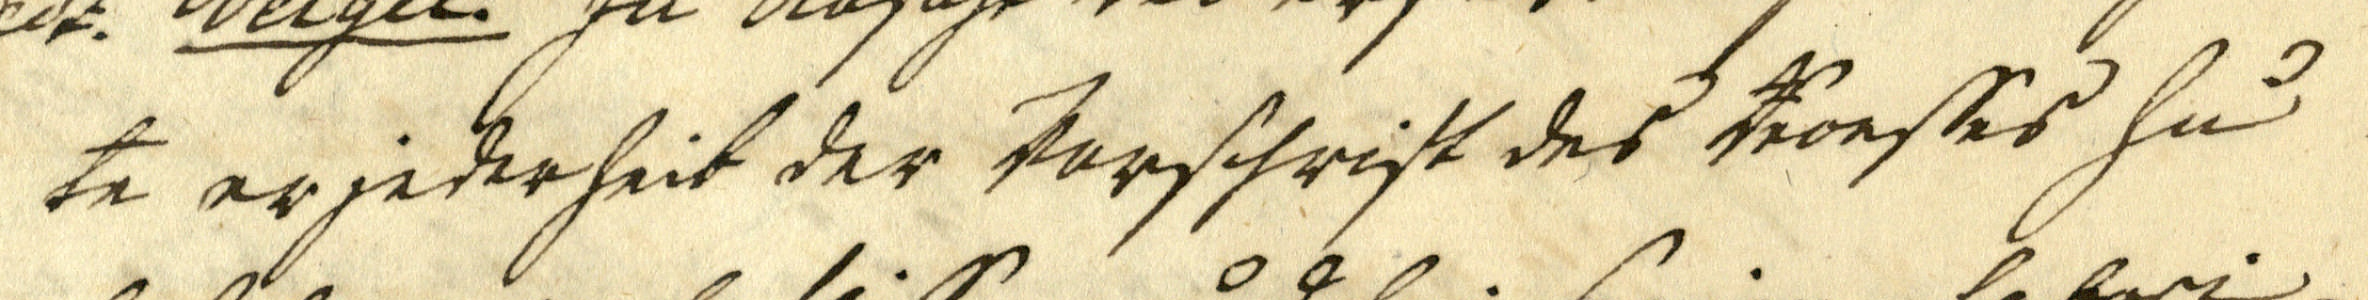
te er jederzeit der Vorschrift des Recesses zu
